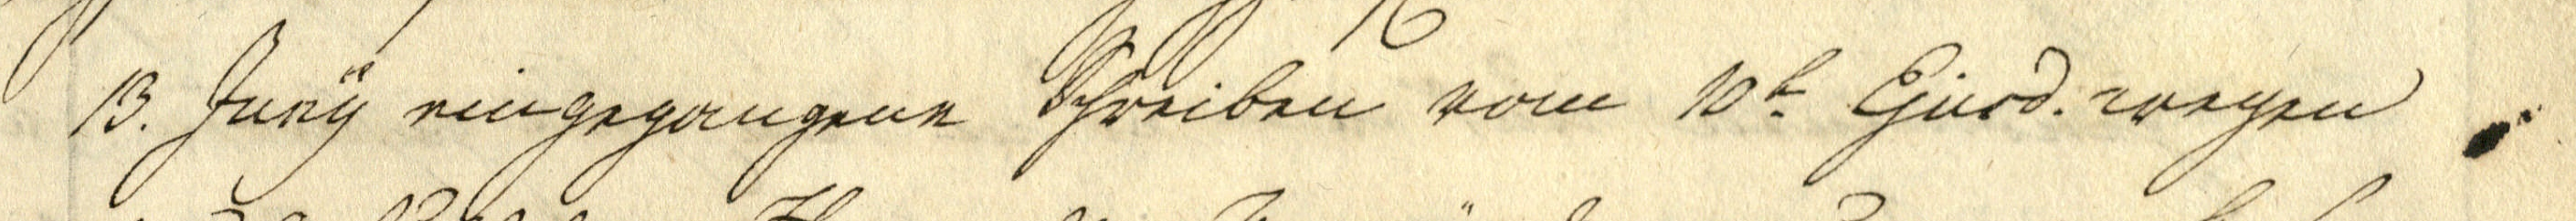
13. Juny eingegangene Schreiben vom 10t. Ejusd. wegen
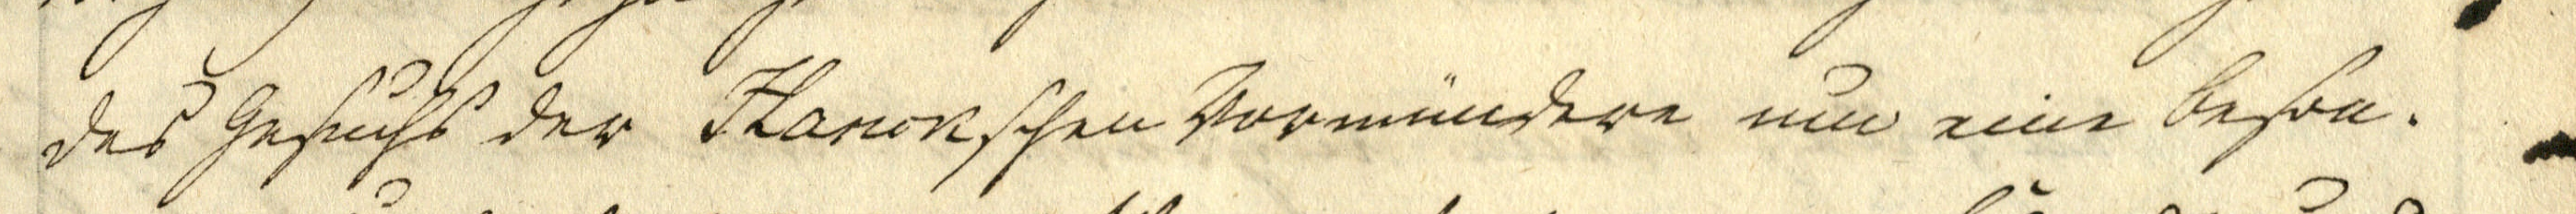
des Gesuchs der Hanckschen Vormündern um eine beson-
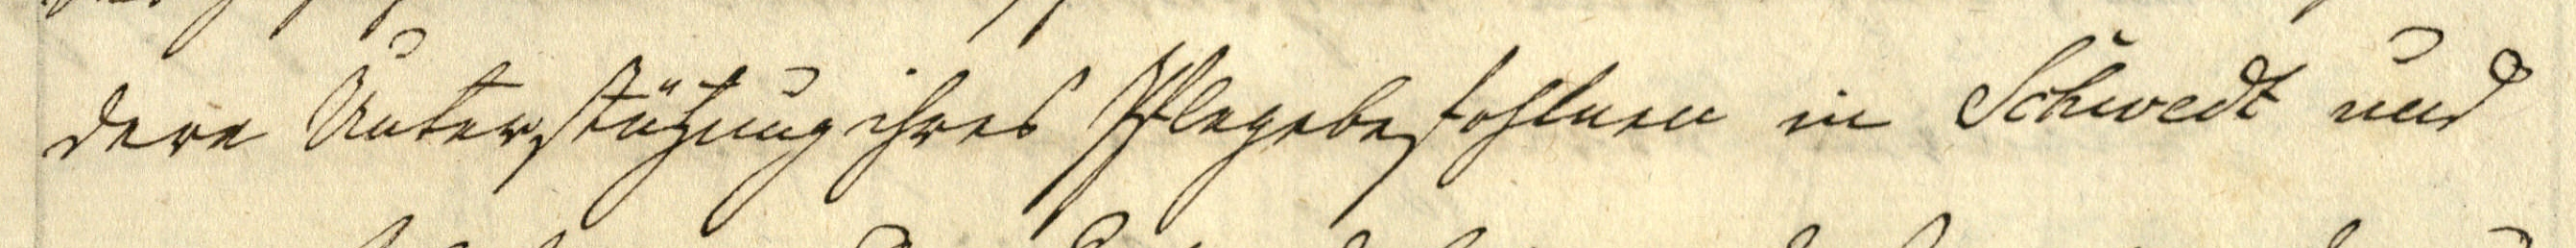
dere Unterstützung ihres Pfelegebefohlnen in Schwedt und
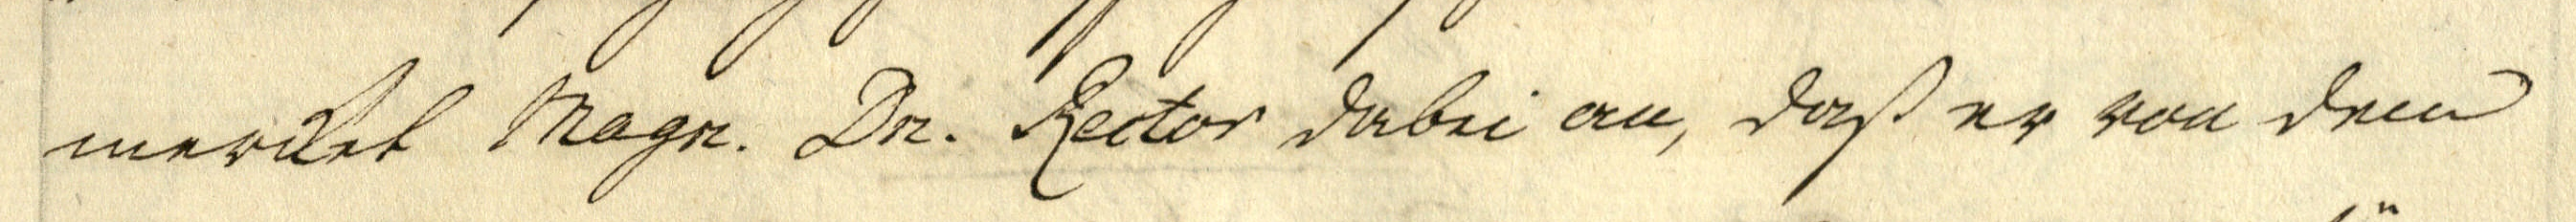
merket Magn. Dn. Rector dabei an, daß er von dem
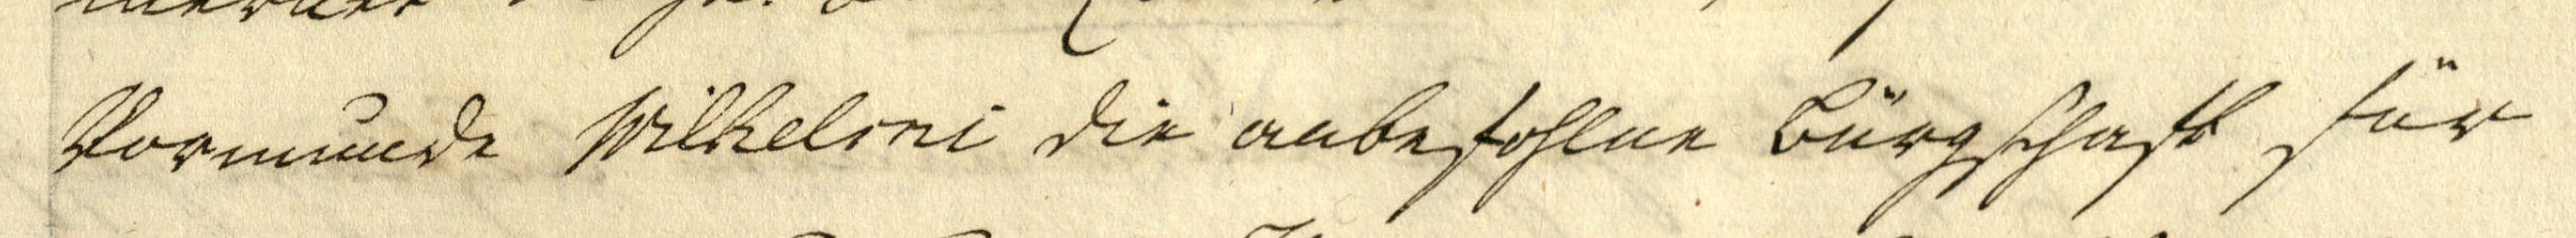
Vormunde Wilhelmi die anbefohlne Bürgschaft für
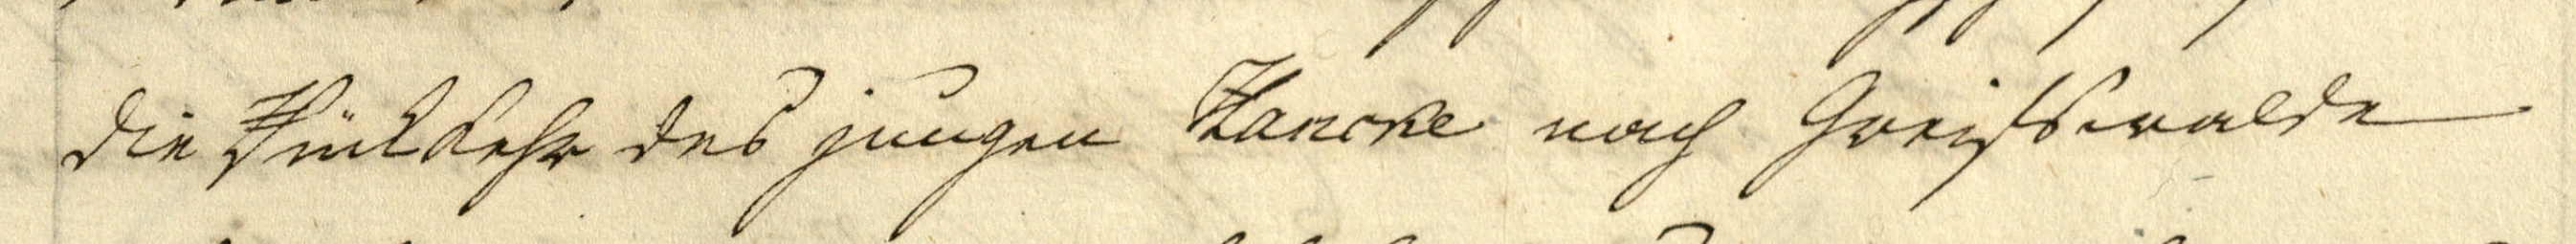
die Rückkehr des jungen Hancke nach Greifswalde
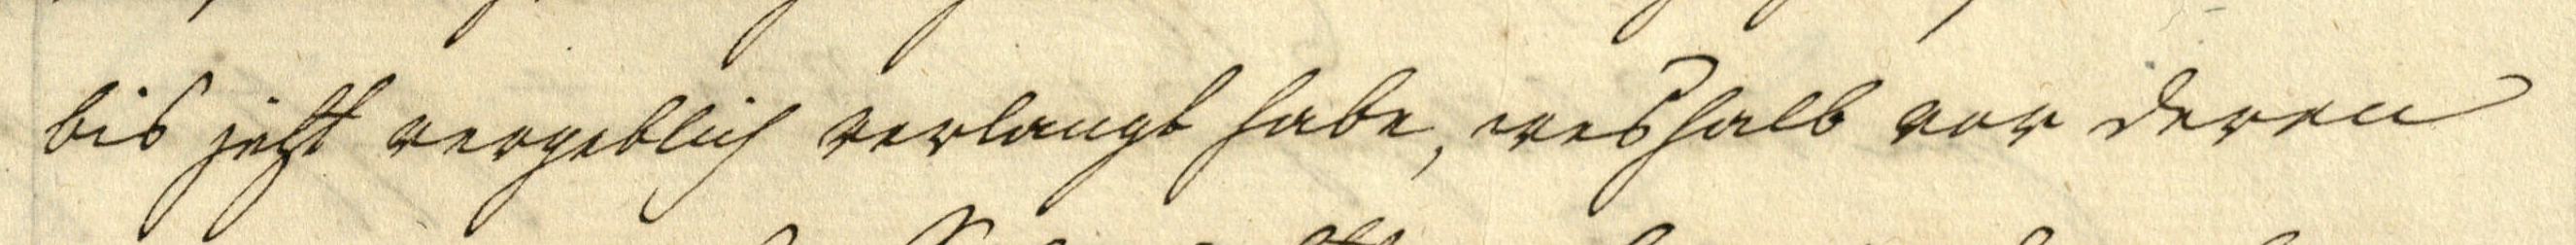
bis jetzt vergeblich verlangt habe, weshalb vor deren
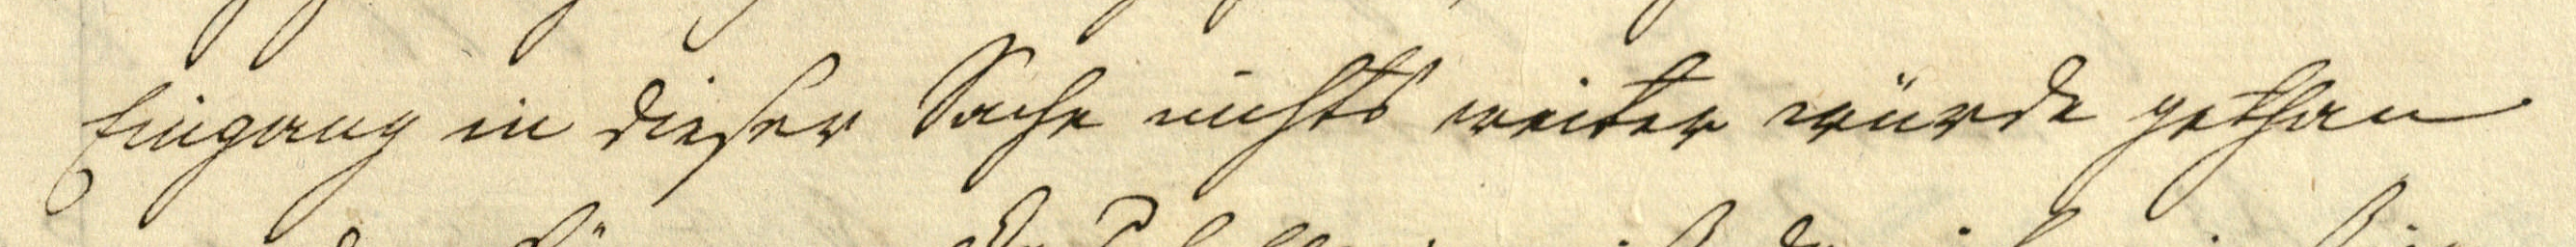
Eingang in dieser Sache nichts weiter würde gethan
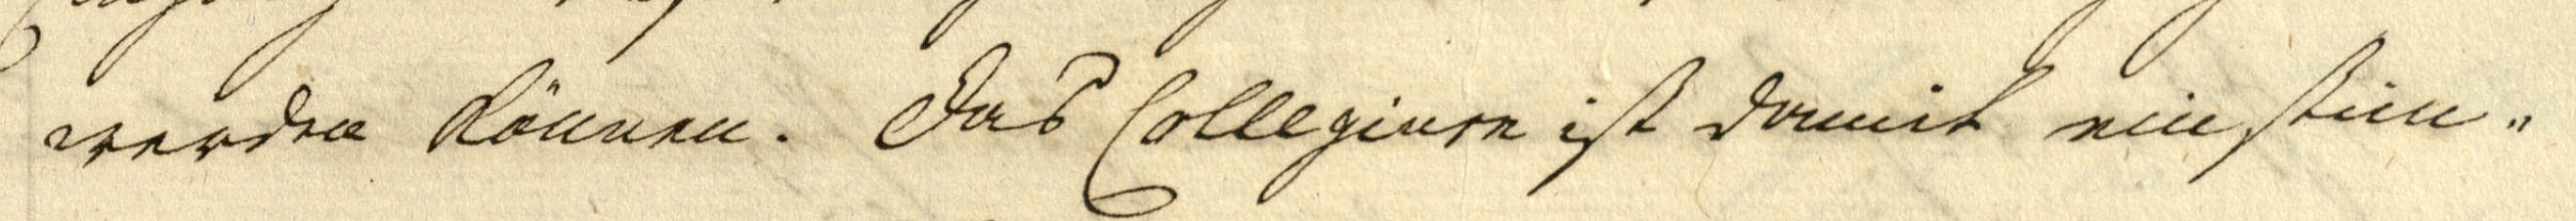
werden können. Das Collegium ist damit einstim-
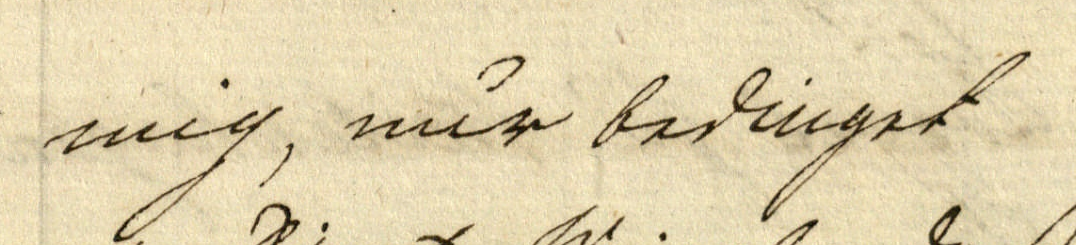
mig, nur bedinget
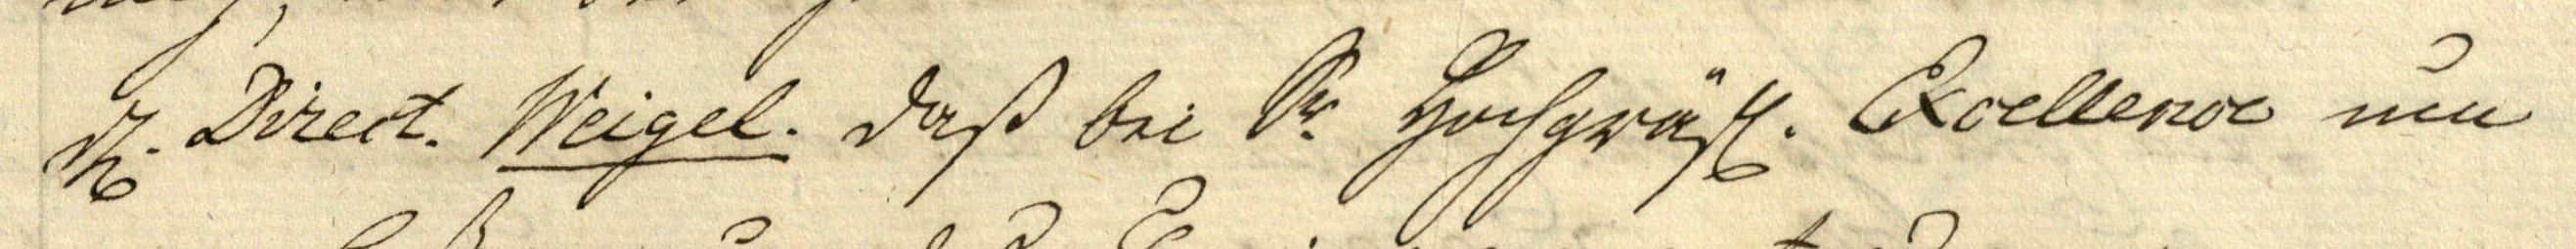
d.h. Direct. Weigel. daß bei Sr. Hochgräfl. Excellence um
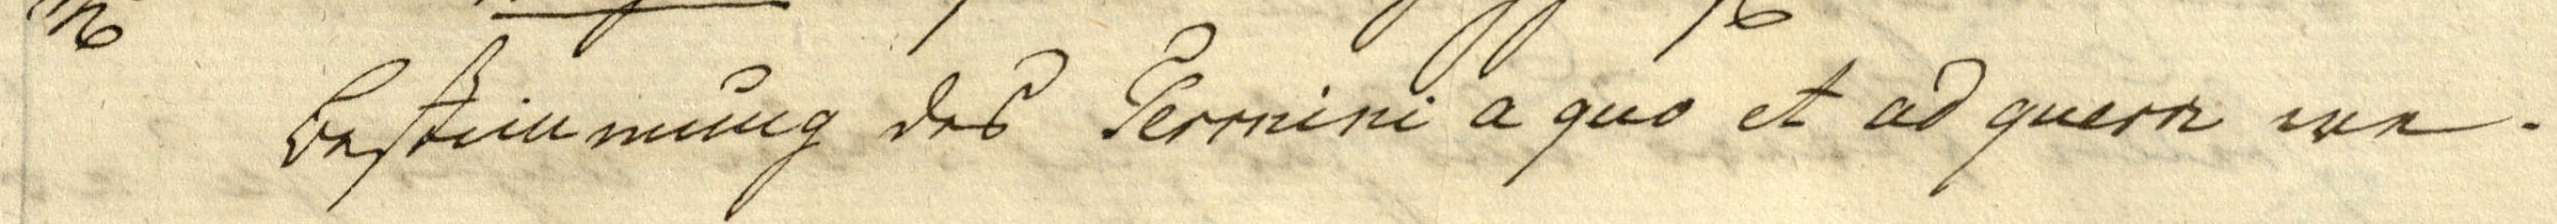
Bestimmung des Termini a quo et ad quem we-
